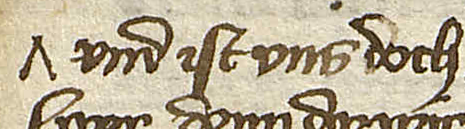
vnd iſt vns doch
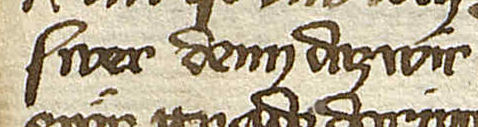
ſwer denn daʒ wir
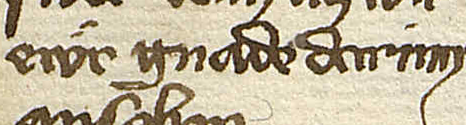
eẅr gnade darinn
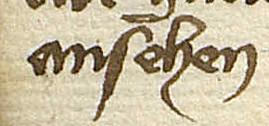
anſehen
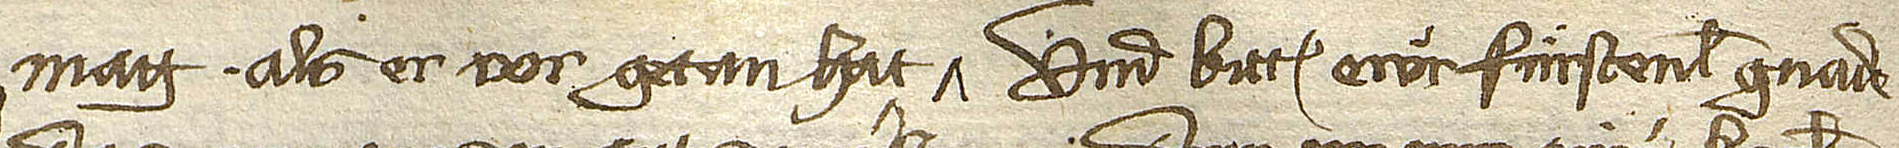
mag . als er vor getan hat Vnd bitt* eẅr fürſtenl* gnade
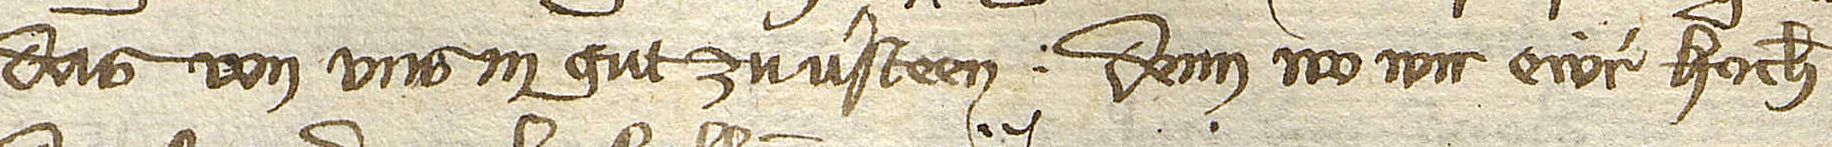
das von vns in gut ʒuu*ſteen . Denn wo wir eẅr* hoch*
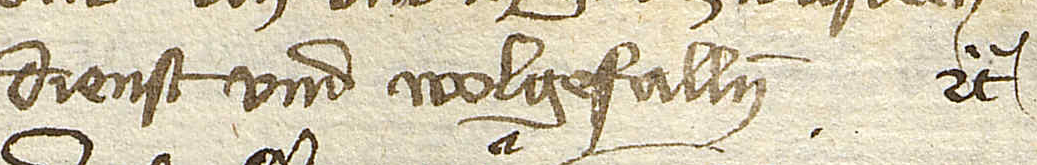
dienſ vnd wolgefalln* ec*
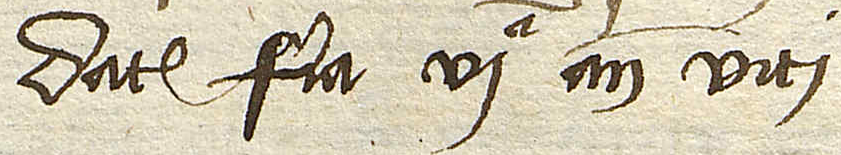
Dat* fi*a vi* an* viti
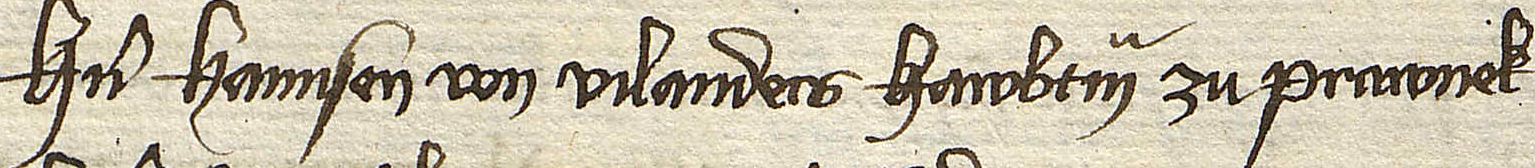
Hn* hannſen von vilanders hawbtm* ʒu Prawnek
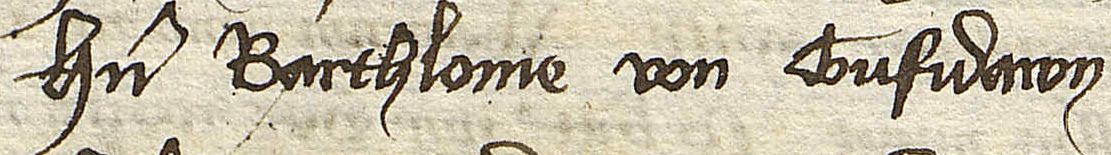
Hn* Barthlome von Gufidawn
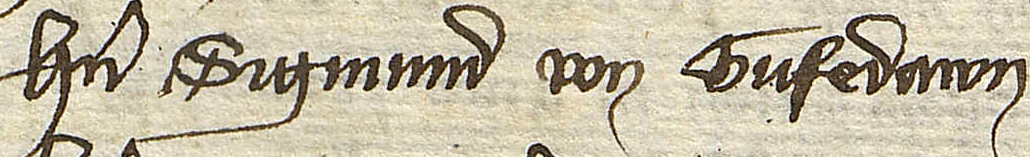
Hn* Sigmund von Gufedawn
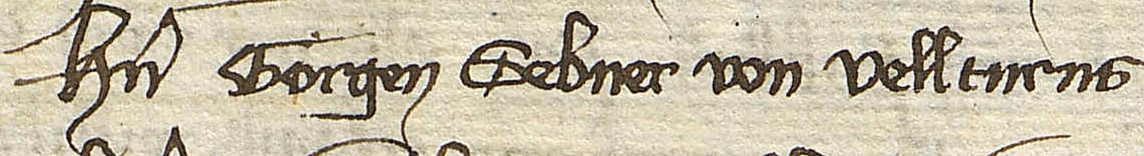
Hn* Görgen Sebner von Vellturns
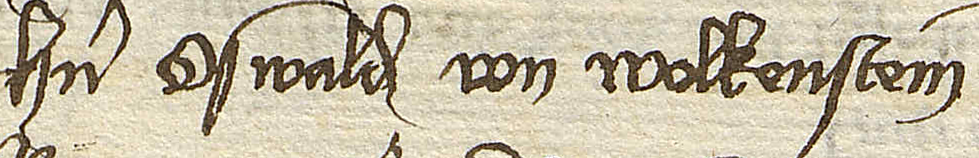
Hn* Oſwald* von wolkenſtein
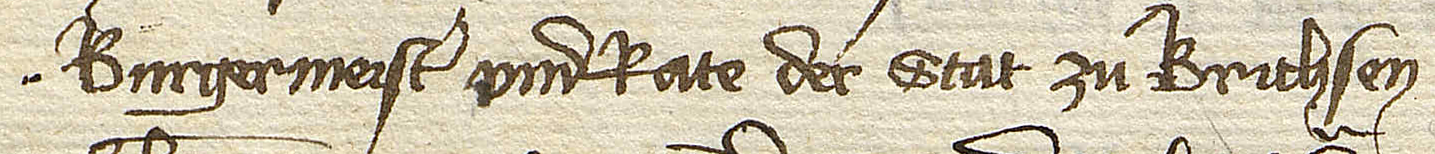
Burgermeiſt* vnd Rate der Stat ʒu Brichſen
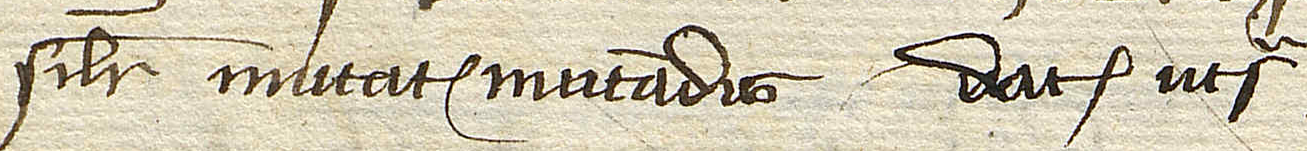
ſilr* mutat* muda*dis / Dat* ut ſ*
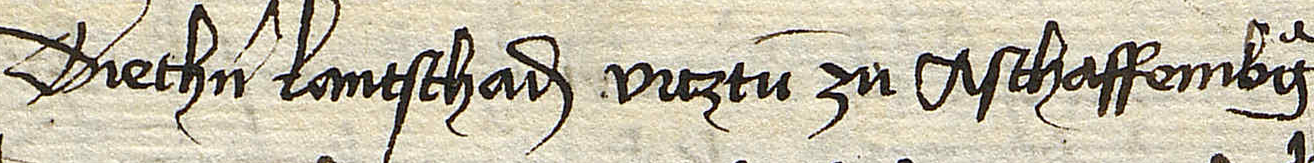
Diethn* lantſchad* vicʒtu* ʒu Aſchaffemb*g
